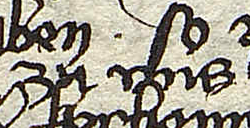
ʒu vns
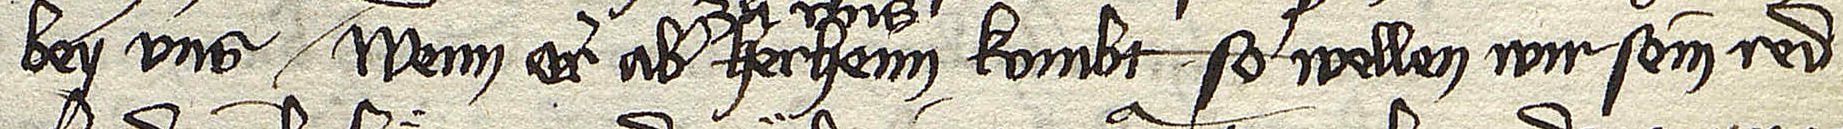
bey vns / Wenn er ab* herheim kombt . ſo wellen wir ſein red
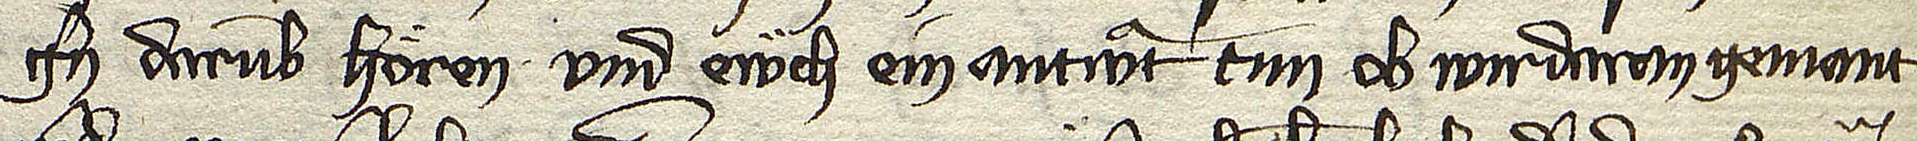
gn* darub* hören . vnd ewch ein antw*t tun ob wir daran gemant
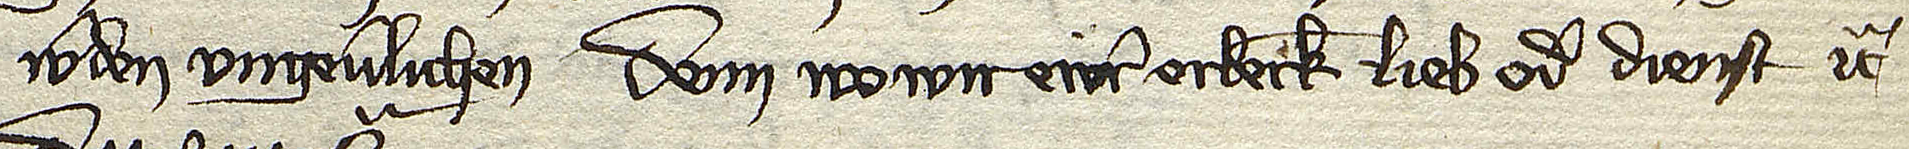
w*den vngeu*lichen / Denn wo wir ew*r erberk* lieb od* dienſt ec*
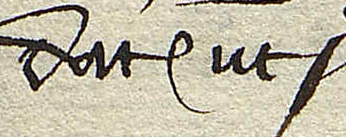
Dat* ut ſ*
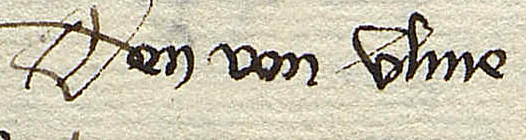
Den von Vlme
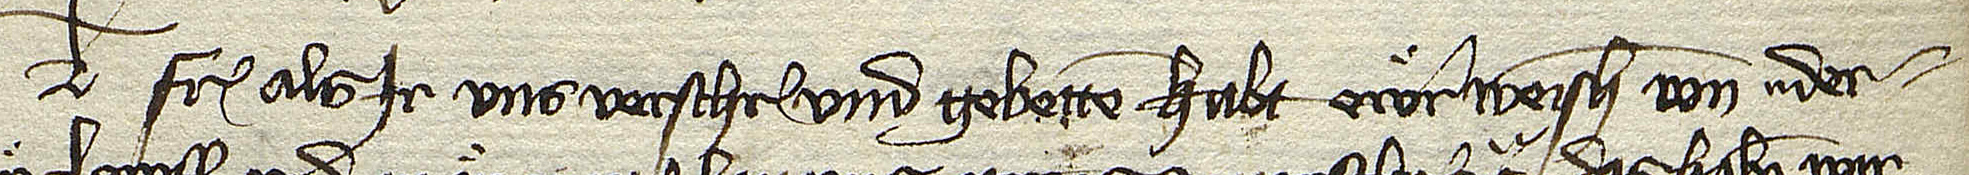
L* fr* als Ir vns verſchr* vnd gebette* habt ew*r weiſh* von ~ der
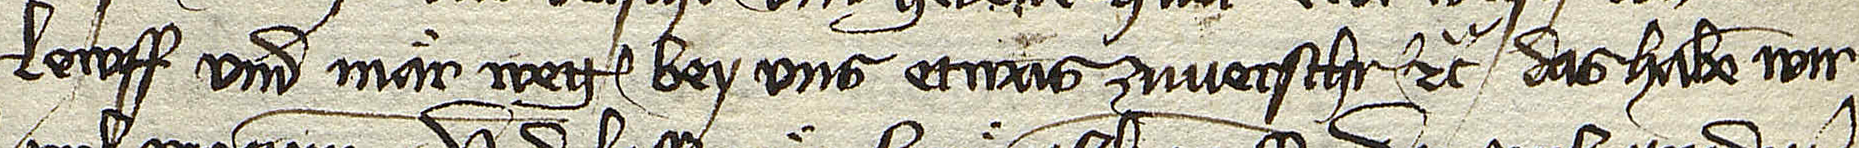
Lewff vnd mär weg* bey vns etwas ʒuuerſchr* ec* das habe* wir
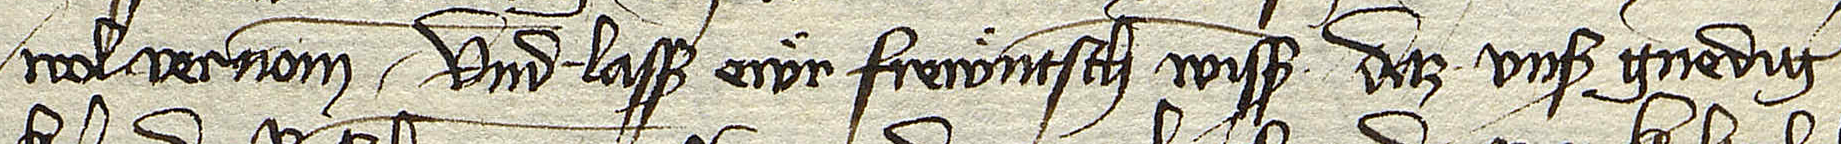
wol vernom* / Vnd laſſ* ewr frewntſch* wiſſ* . daʒ . vnſ* gnedig*
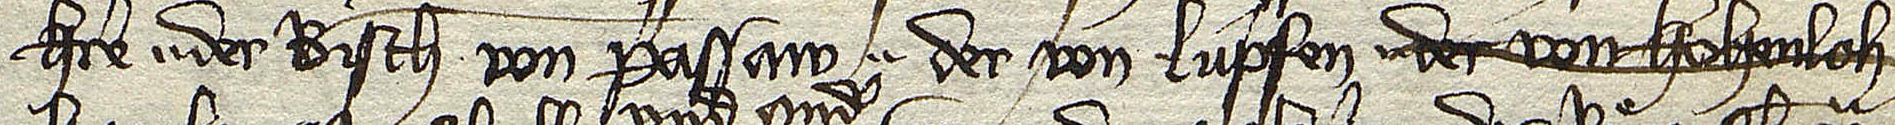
hre* ~ der Biſch* von Paſſaw ~ der von Lüpfen ~ der von Hohenloh
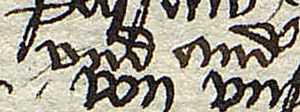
vnd and*
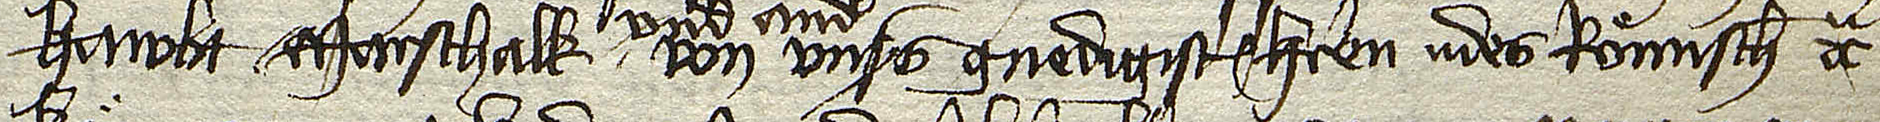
hawbt / Marſchalk von vnſ*s gnedigiſt* h*ren ~ des Römiſch* ec*
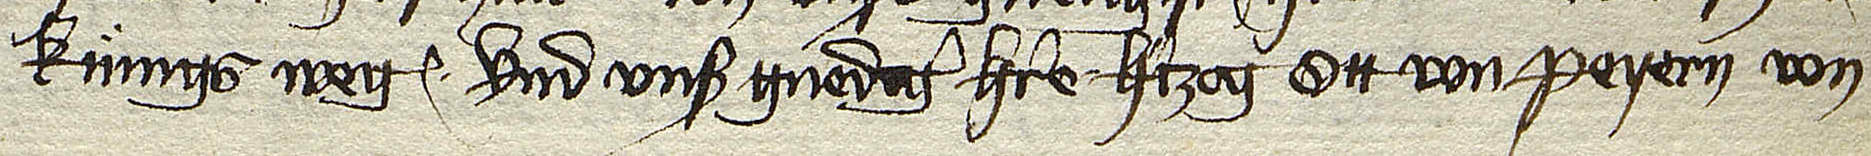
künigs weg* . Vnd vnſ* gnedig* hre* h*cʒog Ott von Peyern von
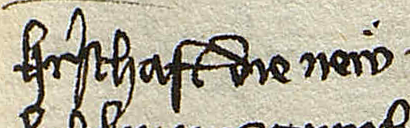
h*rſchaft die new
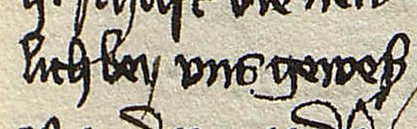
lich bey vns geweſ*
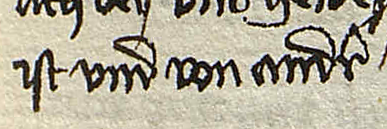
iſt vnd von and*r
